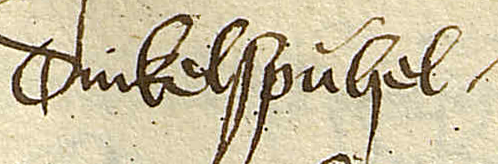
Dinkelſpühel /
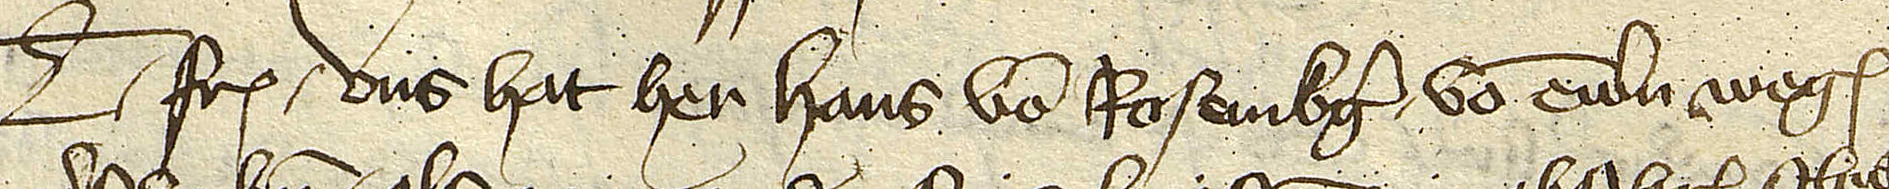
L* / fr* / vns hat her hans vo* Roſembg* / vo* ewn* weg*
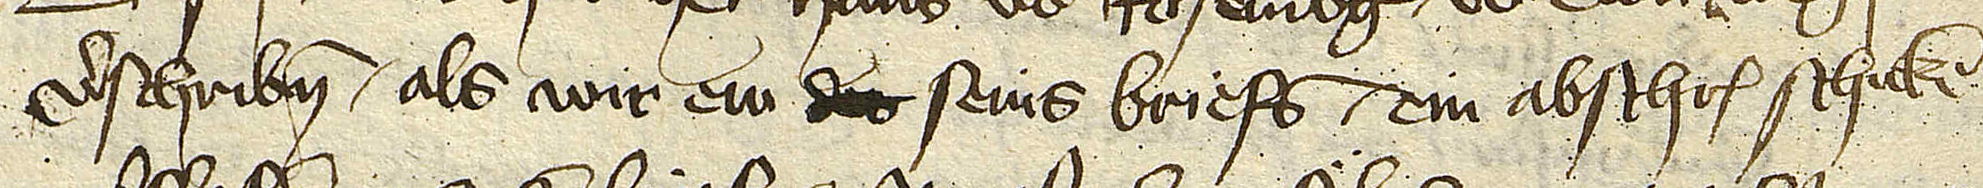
v*ſchribn* / als wir ew des ſeins briefs / ein abſchr* ſchicke*
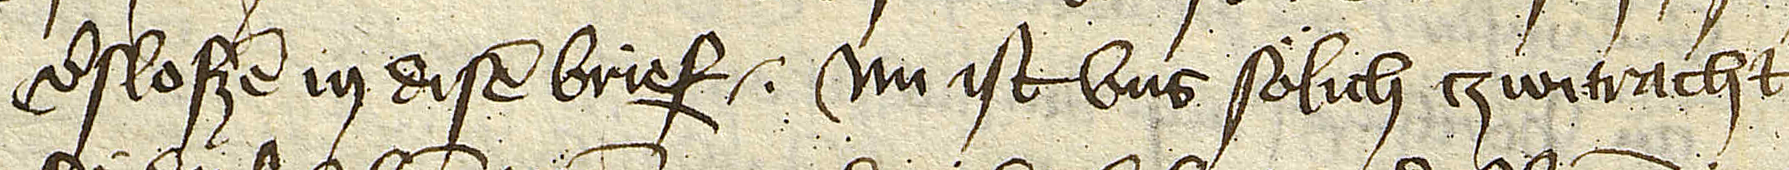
v*ſloſʒe* in diſe* brief / . Nu iſt vns ſölich cʒwitracht
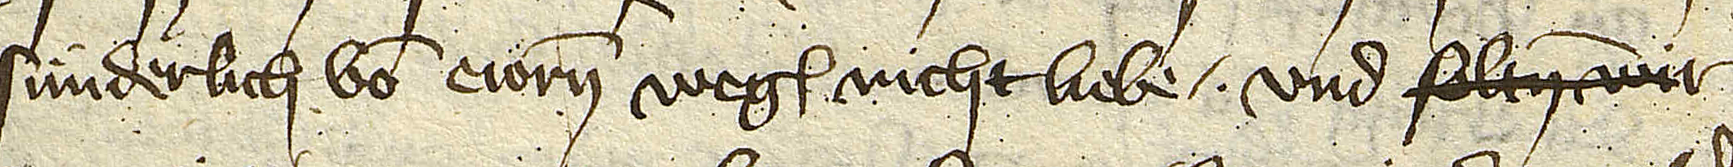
ſünderlich vo* ewrn* weg* nicht liebe / . vnd ſoltn* wir
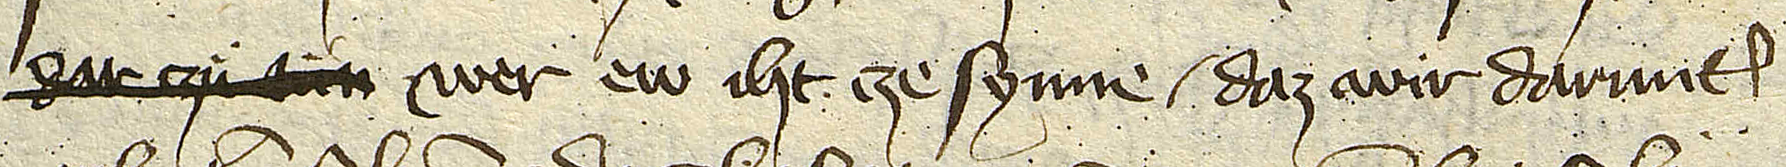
dar cʒü tün wer ew iht cʒeſynne / daʒ wir darunt*
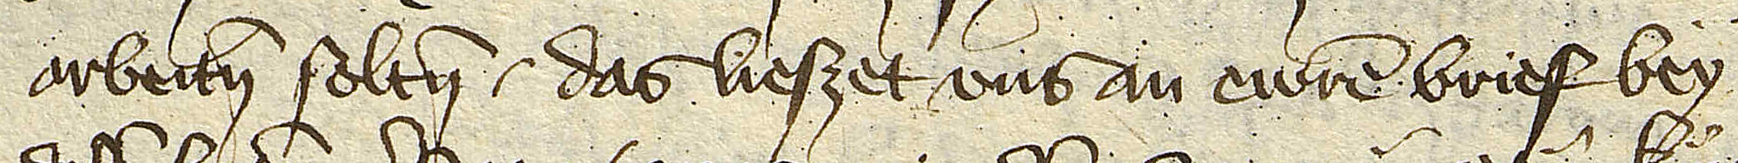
arbeitn* ſoltn* / das lieſʒet vnd an ewre* brief bey
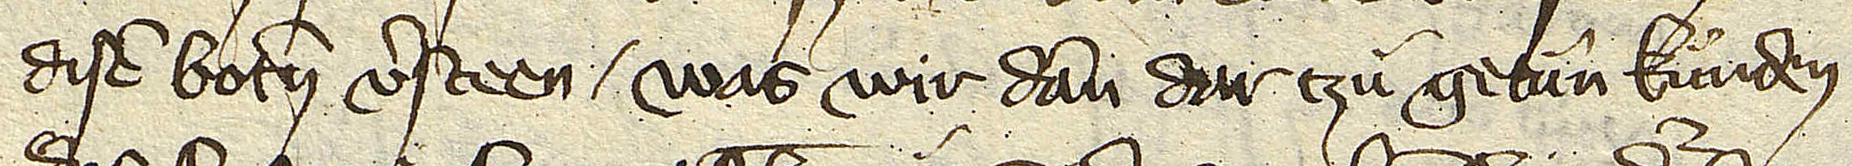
diſe* botn* v*ſteen / was wir dan* dar cʒü getün künden
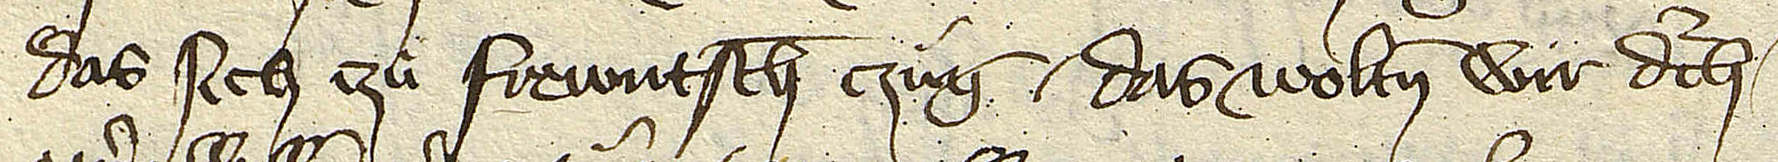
das ſich cʒü frewntſch* cʒüg / das woltn* wir d*ch
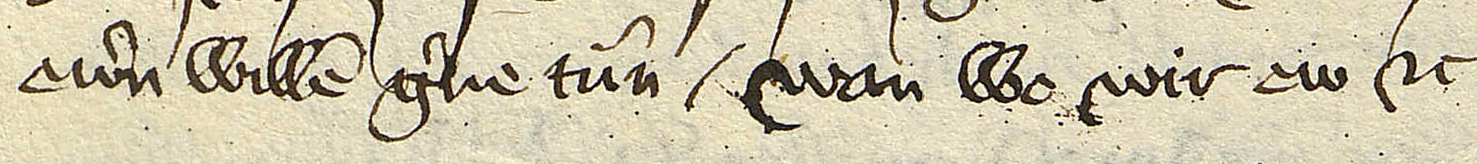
ew*n wille* g*ne tün / wan wo wir ew ec*
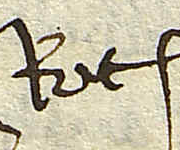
Rot*
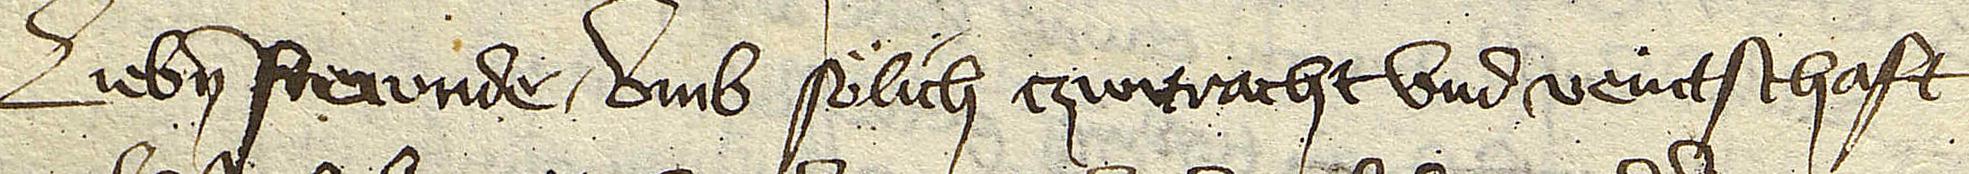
Liebn* frewnde / vmb ſölich cʒwitracht vnd veintſchaft
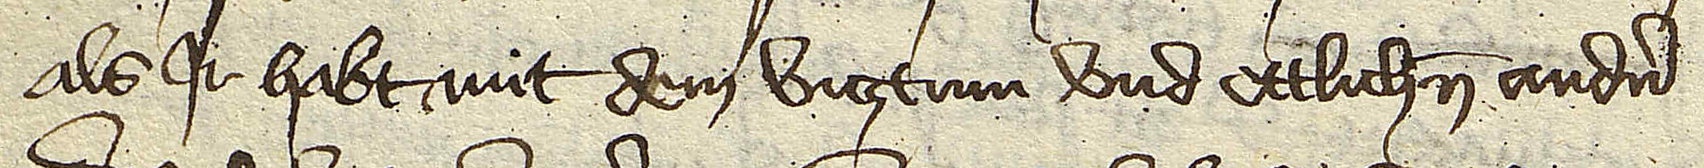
als Ir habt mit dem vicʒtum vnd ettlichn* andn*
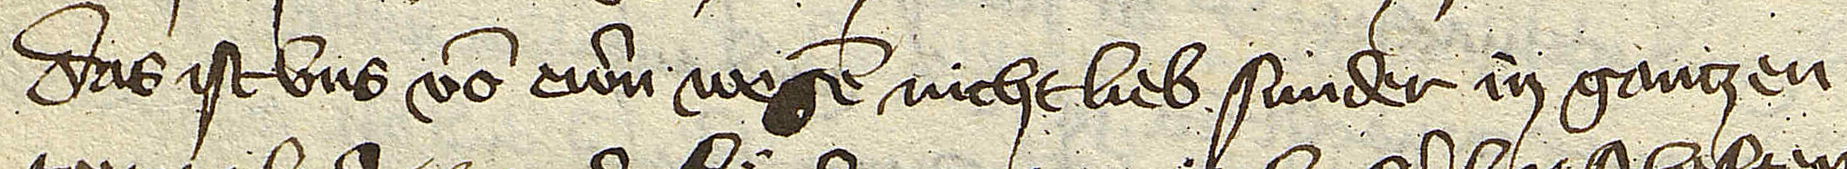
Das iſt vns vo* ewn* wege* nicht lieb ſunder in gancʒen
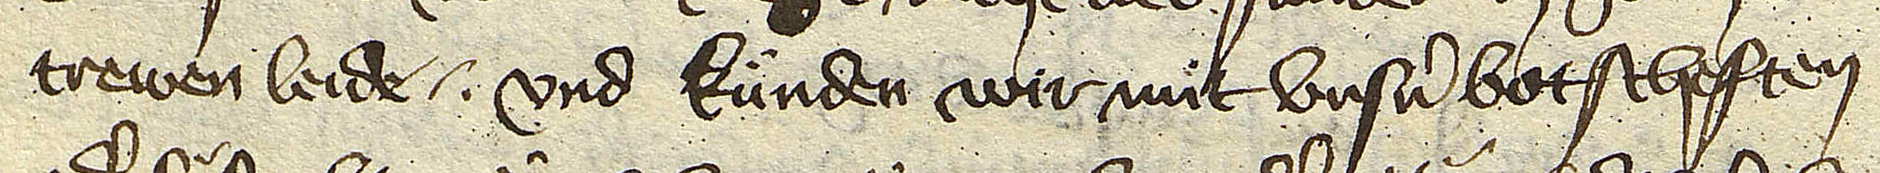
trewen leide / . vnd künden wir mit vnſn* botſcheften
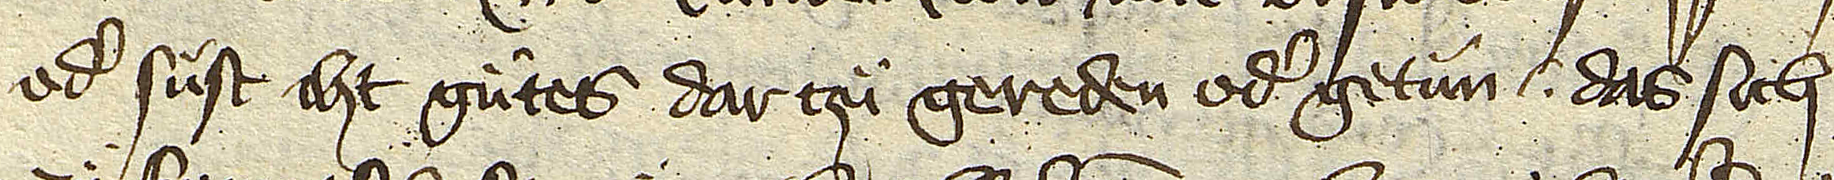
od* ſüſt iht gütes dar cʒü gereden od* getün / . das ſich
